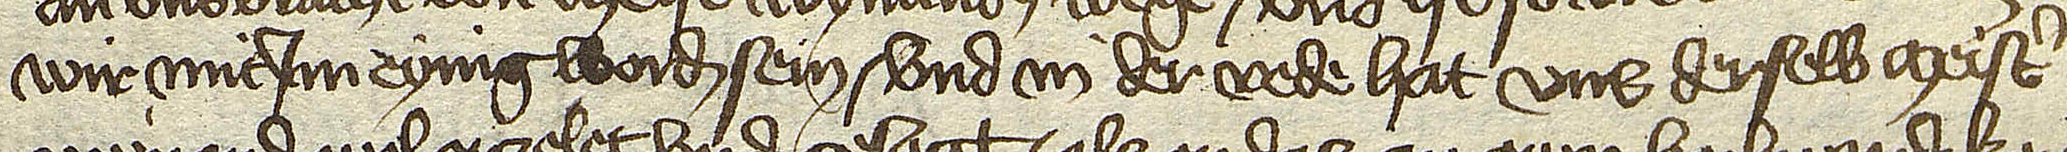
wir mit Im eynig word ſein / vnd in der rede hat vns derſelb Meiſt*
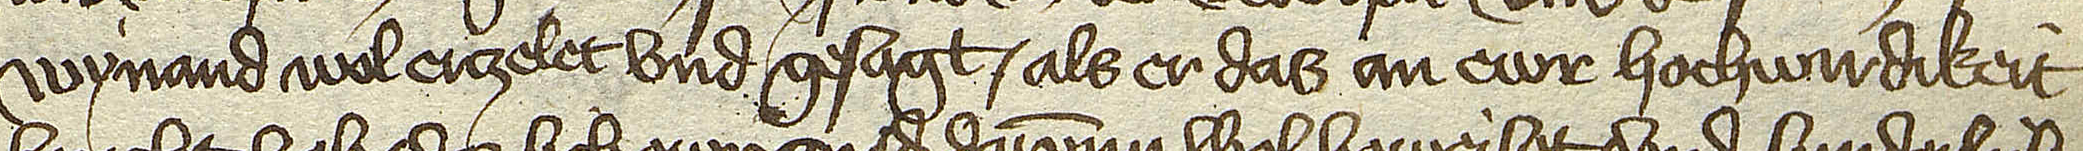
wynand wol ercʒelet vnd geſagt / als er das an ewr hochwirdikeit
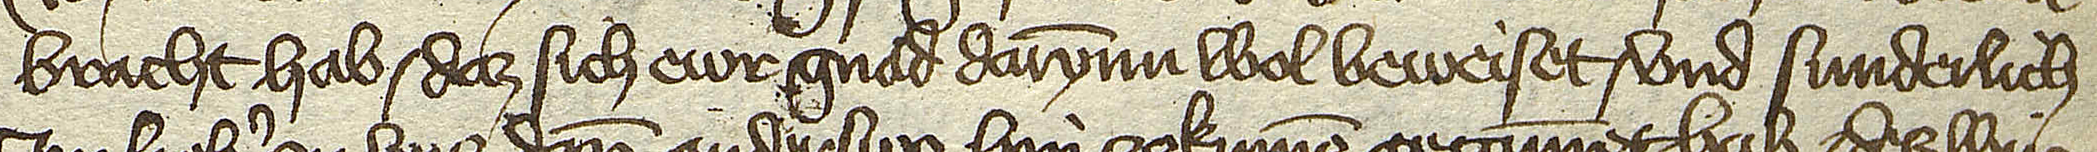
bracht hab / daʒ ſich ewr gnad darynn* wol beweiſet / vnd ſunderlich
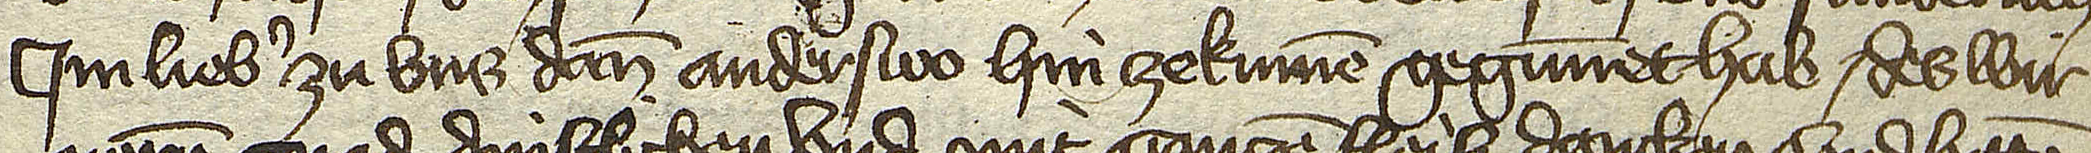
Im lieb* cʒu vns dan* anderſwo hin cʒekume* gegunet* hab / des wir
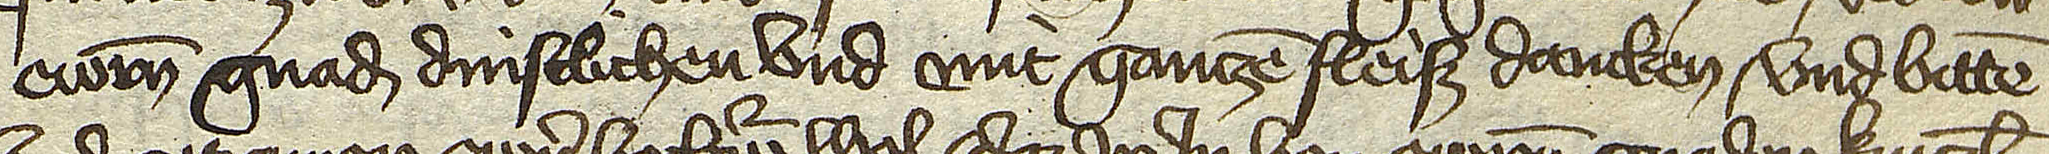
ewrn* gnad* dinſtlichen vnd mit gancʒe* fleiſʒ dancken / vnd bitte*
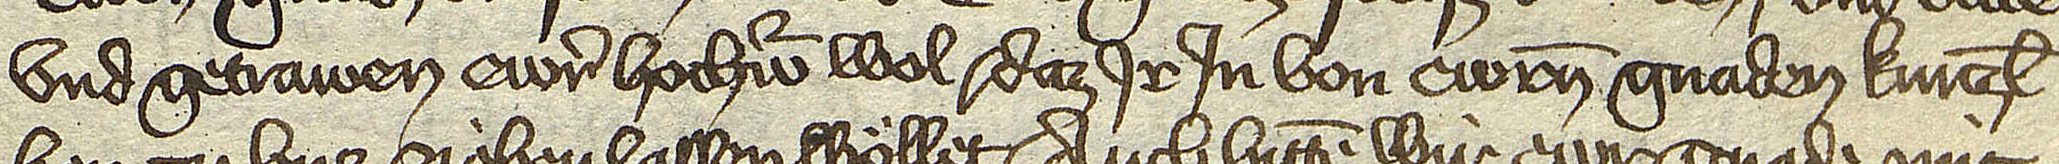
vnd getrawen ewr* hochw* wol / daʒ Ir In von ewrn* gnaden kurcʒl*
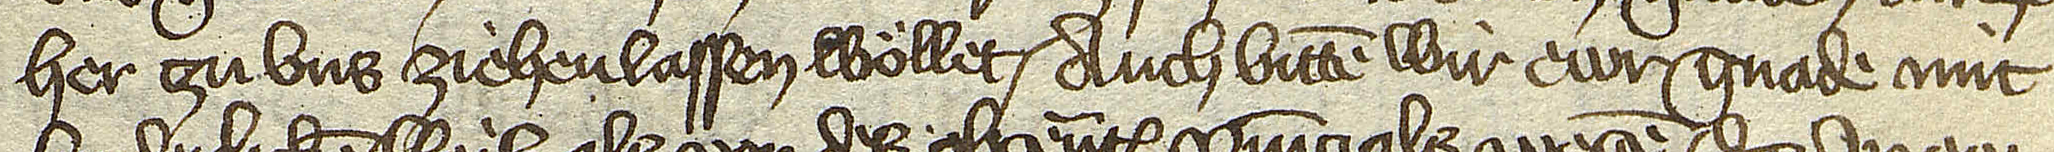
her cʒu vns cʒiehen laſſen wöllet / Auch bitte* wir ewr gnade mit
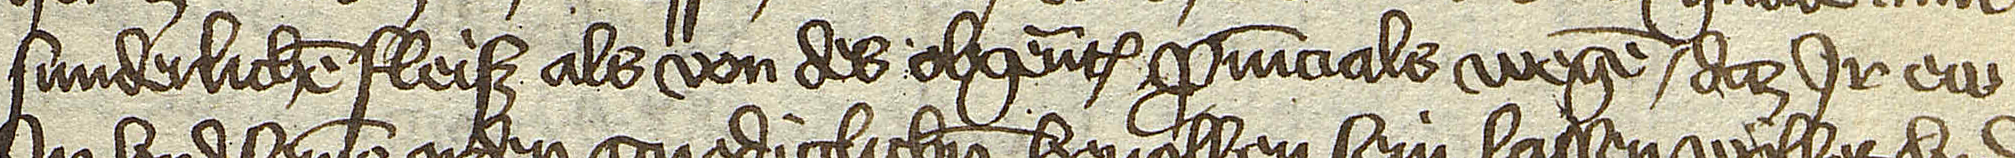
ſunderliche* fleiſʒ als von des obgent* P*incials wege* / daʒ Ir ew
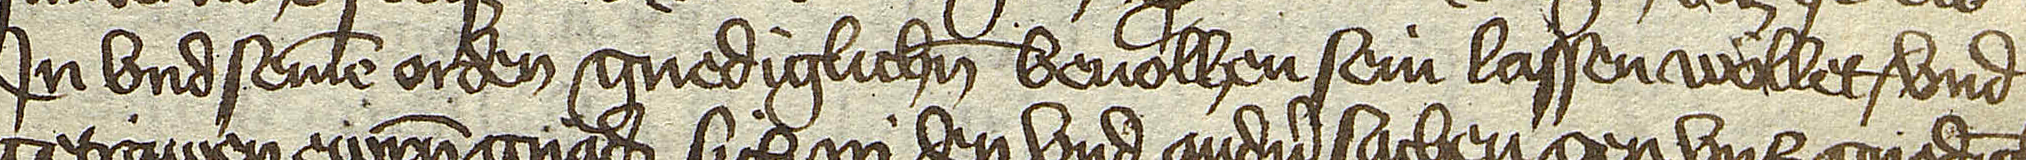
In vnd ſeine* orden gnediglichn* beuolhen ſein laſſen wöllet / vnd
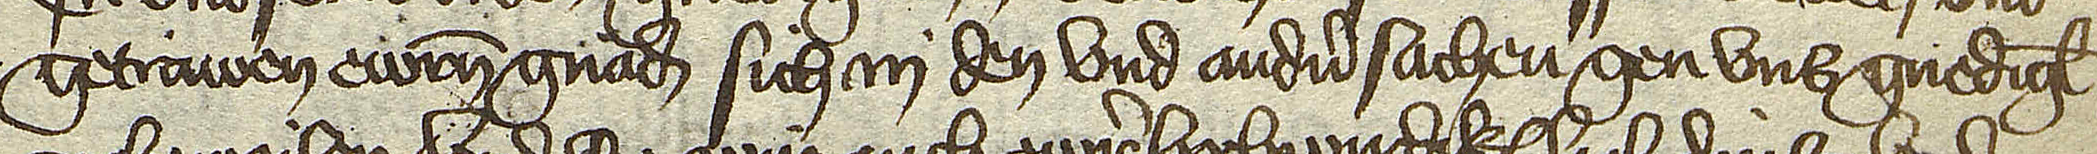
getrawen ewrn* gnad* ſich in den vnd andn* ſachen gen vns gnedigl*
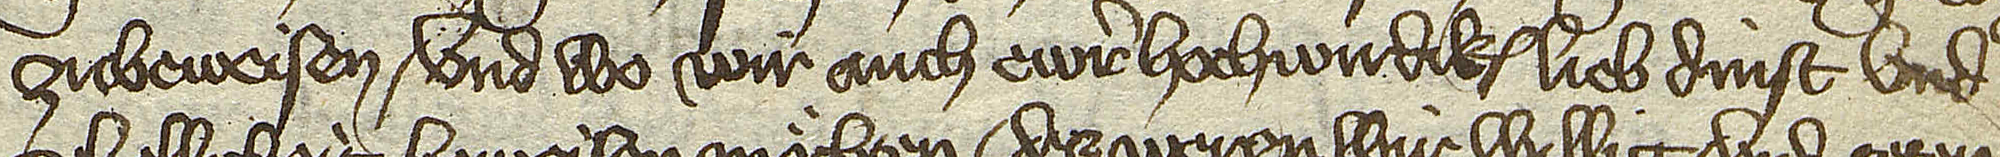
cʒubeweiſen / vnd wo wir auch ewr* hochwirdik* lieb dinſt vnd
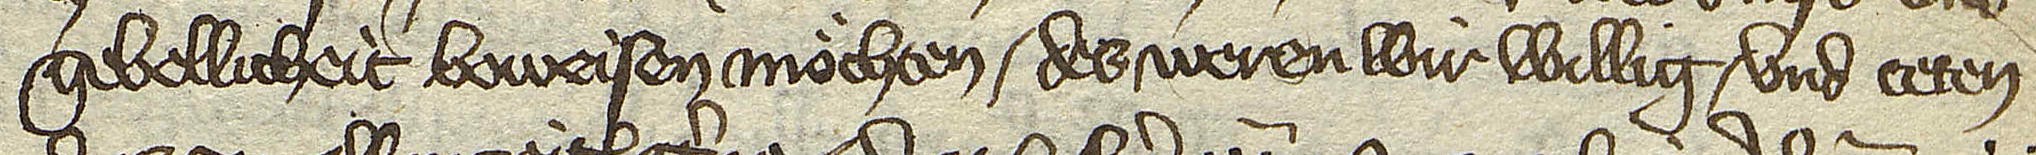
gevellicheit beweiſen möchten / des weren wir willig / vnd teten
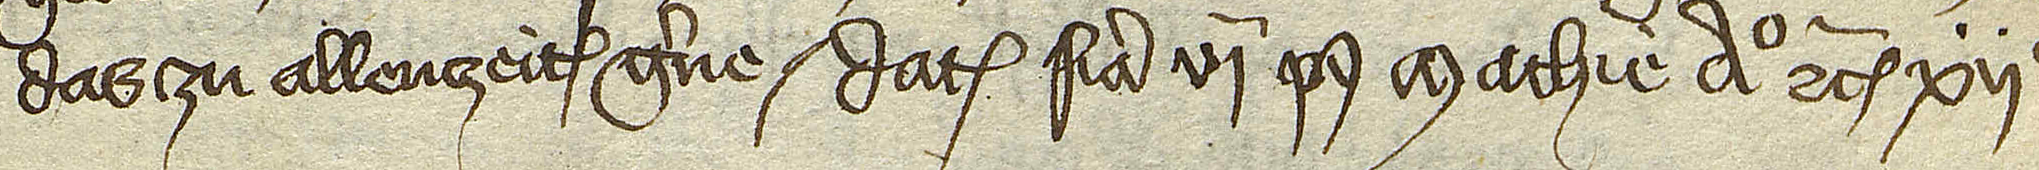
das cʒu allencʒeit* g*ne / Dat* fia* vi* p* Mathie* A* ec* xii*
